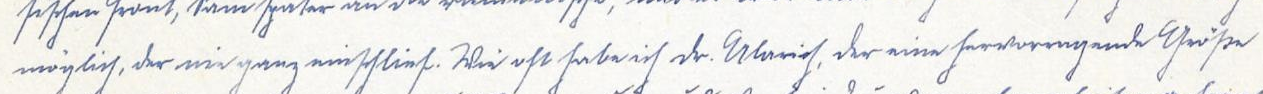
möglich, der nie ganz einschlief. Wie oft habe ich Dr. Alarich, der eine hervorragende Größe
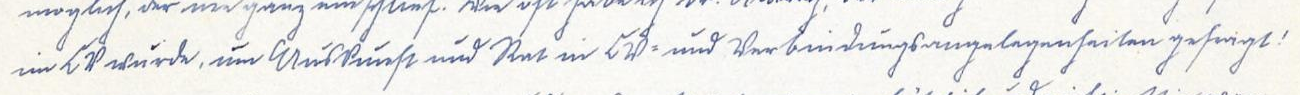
im CV wurde, um Auskünfte und Rat in CV- und Verbindungsangelegenheiten gefragt!
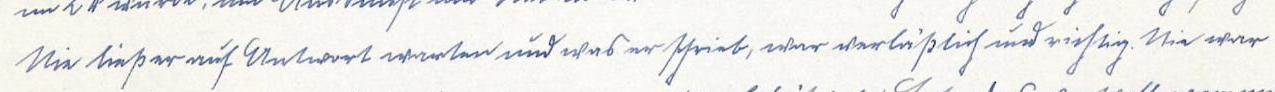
Nie ließ er auf Antwort warten und was er schrieb, war verlässlich und richtig. Nie war
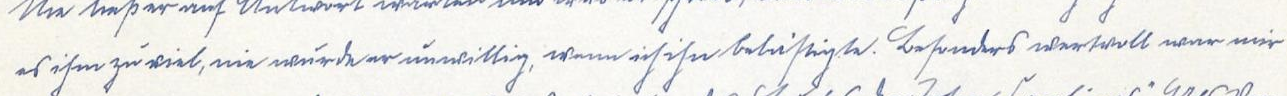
es ihm zu viel, nie wurde er unwillig, wenn ich ihn belästigte. Besonders wertvoll war mir
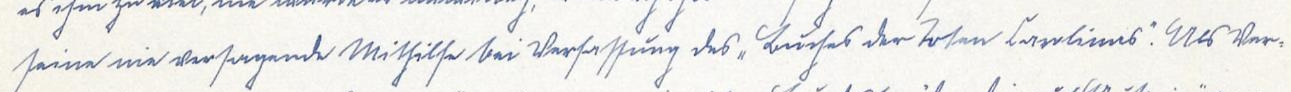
seine nie versagende Mithilfe bei Verfassung des „Buches der Toten Carolinas“. Als Ver-
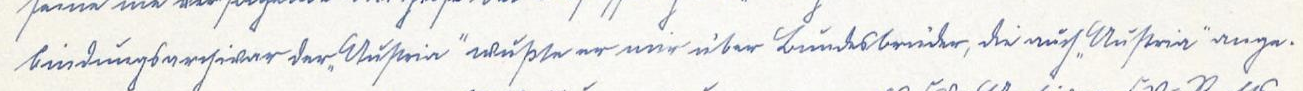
bindungsarchivar der „Austria“ wusste er mir über Bundesbrüder, die noch „Austria“ ange-
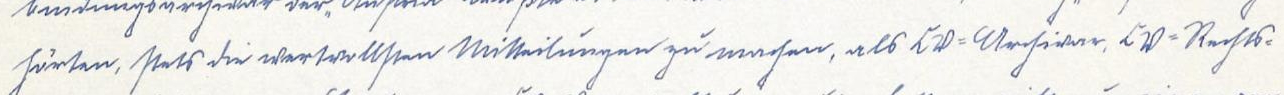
hörten, stets die wertvollsten Mitteilungen zu machen, als CV-Archivar, CV- Rechts-
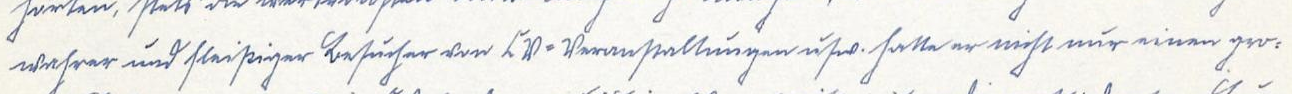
wahrer und fleißiger Besucher der CV-Veranstaltungen usw. hatte er nicht nur einen gro-
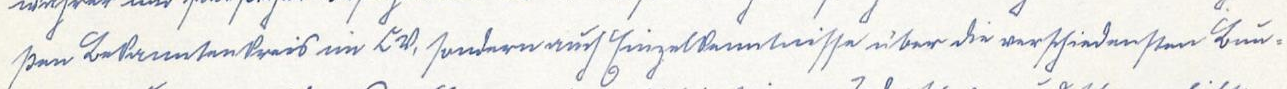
ßen Bekanntheitsgrad im CV, sondern auch Einzelkenntnisse über die verschiedensten Bun-
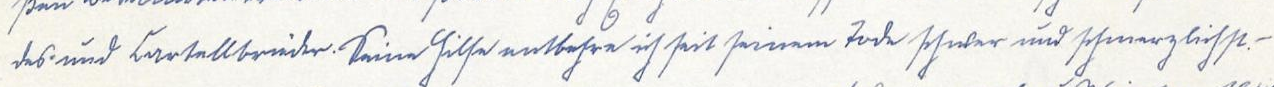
des- und Cartellbrüder. Seine Hilfe entbehre ich seit seinem Tode schwer und schmerzlichst.-
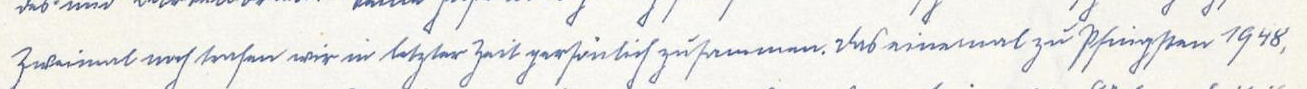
Zweimal noch trafen wir in letzter Zeit persönlich zusammen. Das einemal zu Pfingsten 1948,
